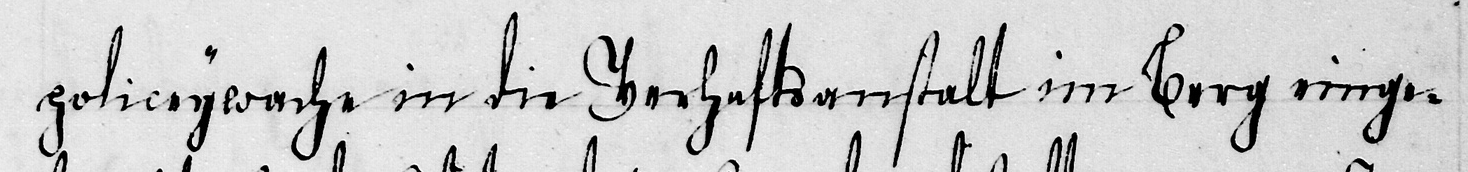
policeywache in die Verhaftsanstalt im Berg einge¬
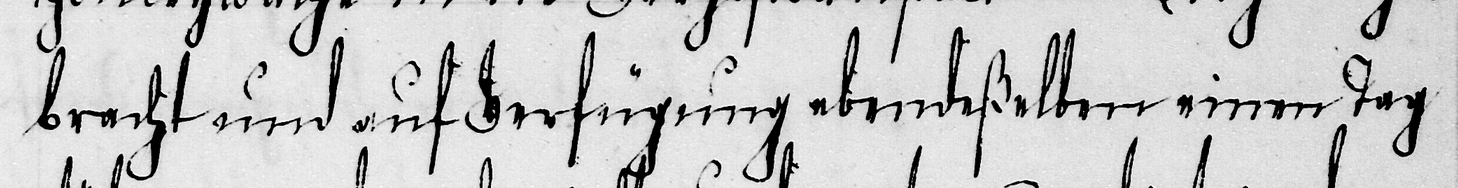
bracht und auf Verfügung ebendeßelben einen Tag
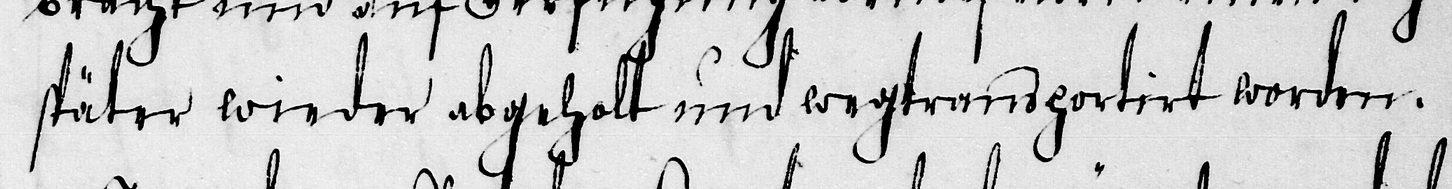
später wieder abgeholt und wegtransportirt worden.
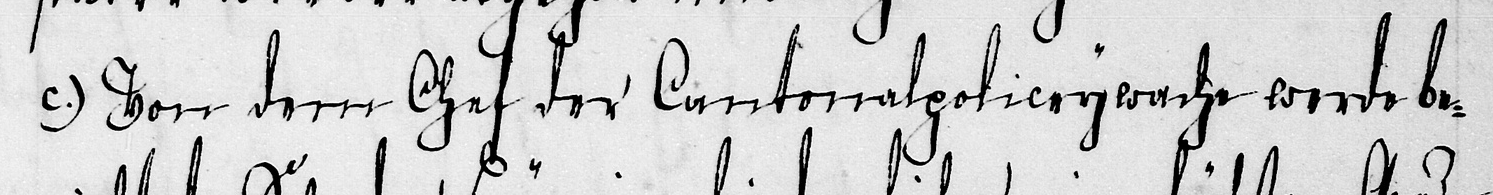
c.) Von dem Chef der Cantonalpoliceywache werde be¬
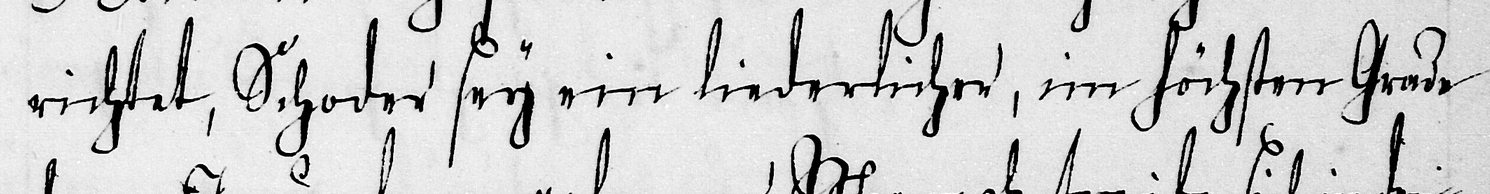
richtet, Schoder sey ein liederlicher, im höchsten Grade
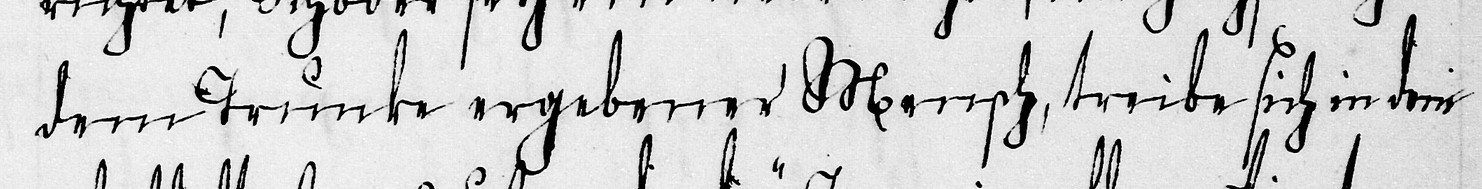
dem Trunke ergebener Mensch, treibe sich in dem
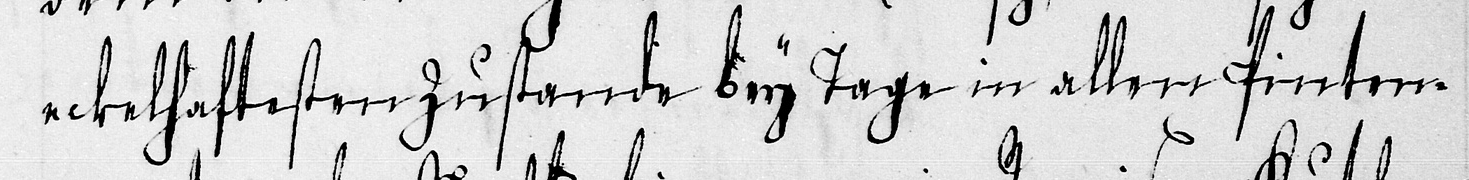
eckelhaftesten Zustande bey Tage in allen Pinten¬
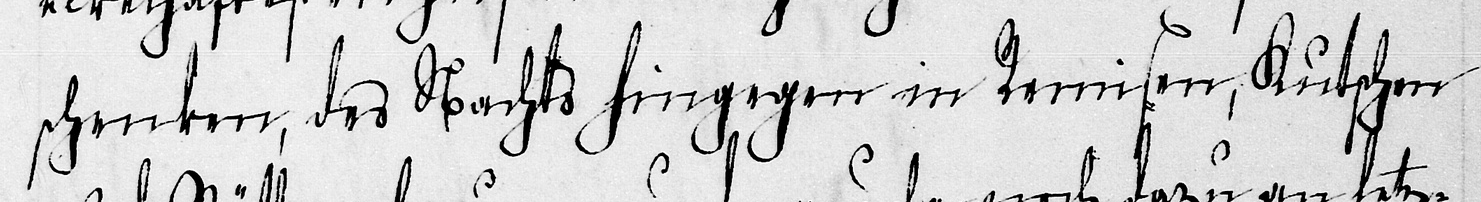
schenken, des Nachts hingegen in Remisen, Kutschen
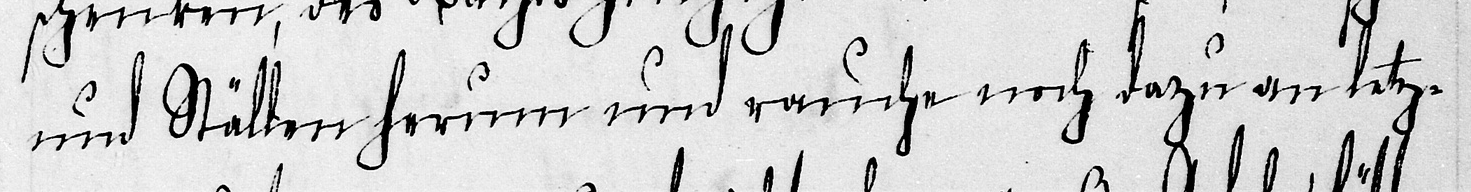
und Ställen herum und rauche noch dazu an letz¬
